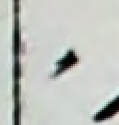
„
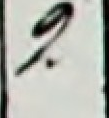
2
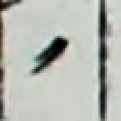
„
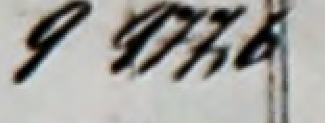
9 977,6
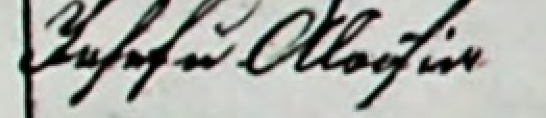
Josef u Aloisia
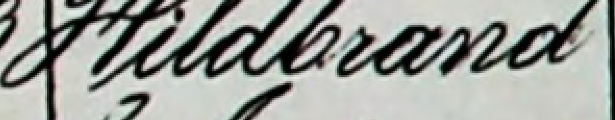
Hildbrand
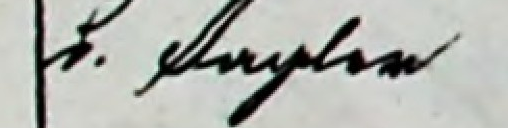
u. ?agter
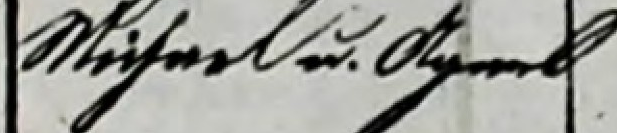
Michael u. Agnes
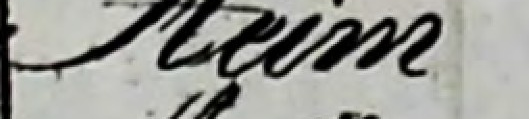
Heim
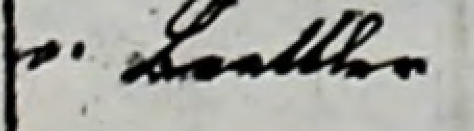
v. Brettler
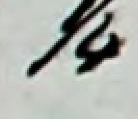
1/4
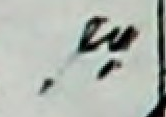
Do
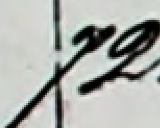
72
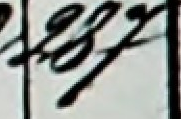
287
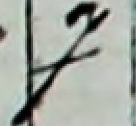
7
